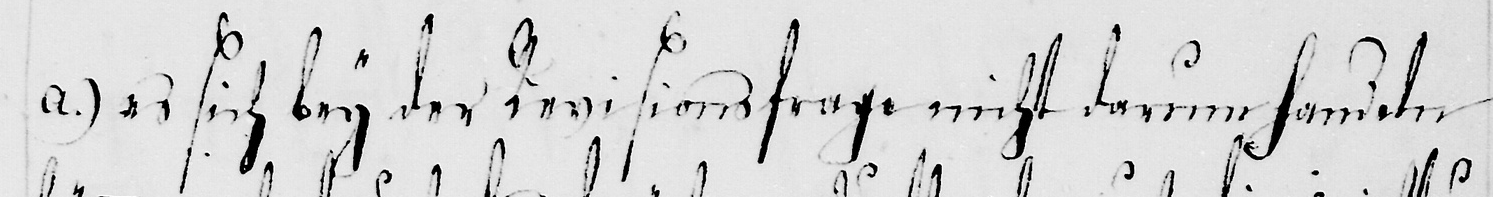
es sich bey der Revisionsfrage nicht darum handeln
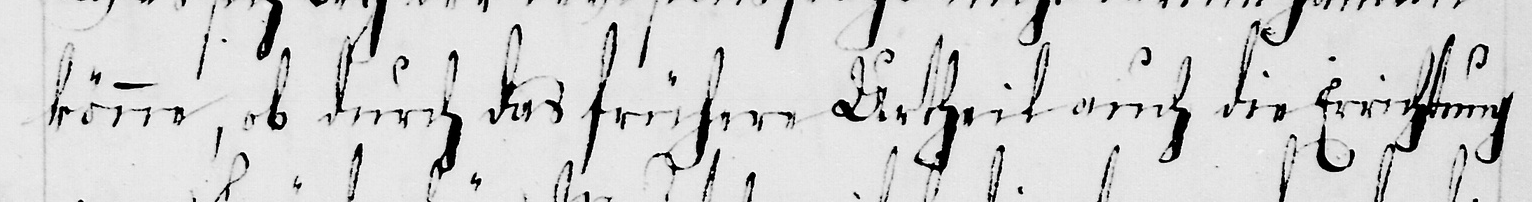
könne, ob durch das frühere Urtheil auch die Errichtung
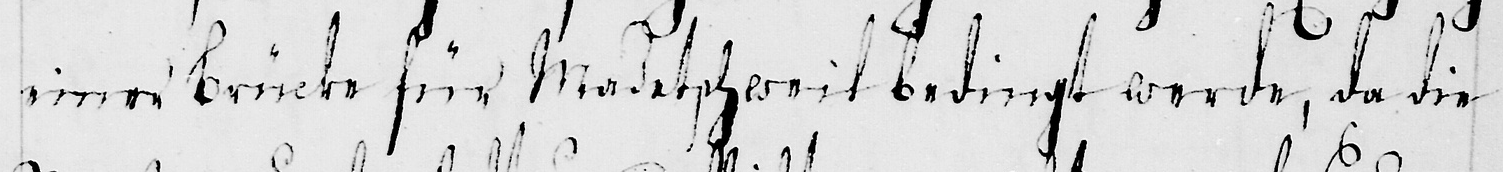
einer Brücke für Madetschweil bedingt werde, da die
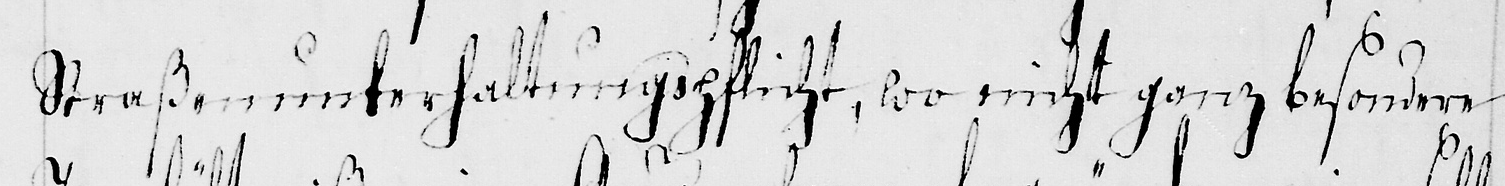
Straßenunterhaltungspflicht, wo nicht ganz besondere
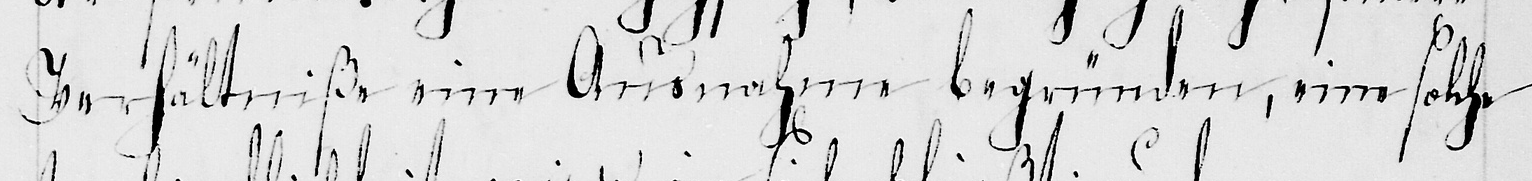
Verhältniße eine Ausnahme begründen, eine solche
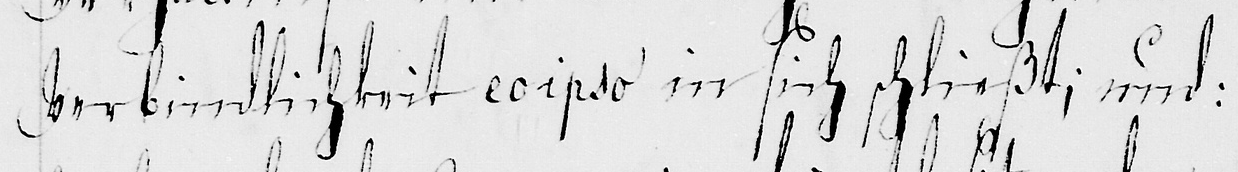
Verbindlichkeit eo ipso in sich schließt; und:
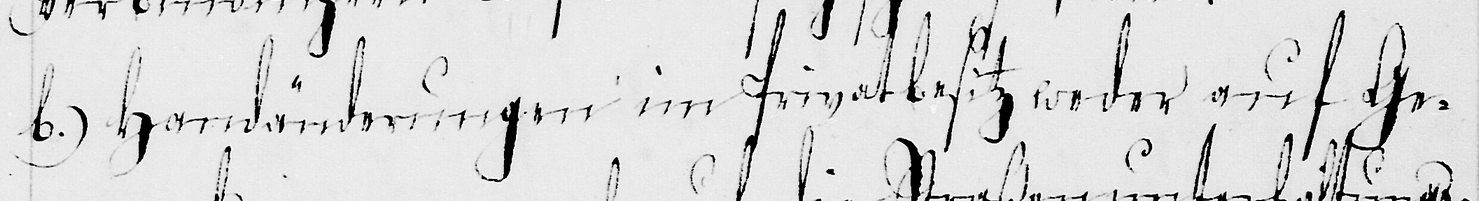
b.) Handänderungen im Privatbesitz weder auf Ge¬
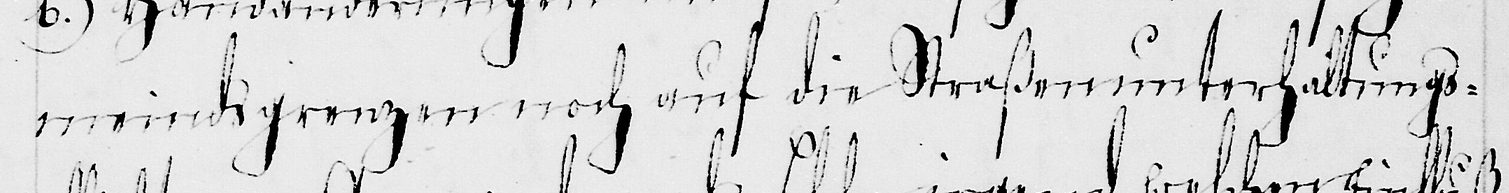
meindsgrenzen noch auf die Straßenunterhaltungs¬
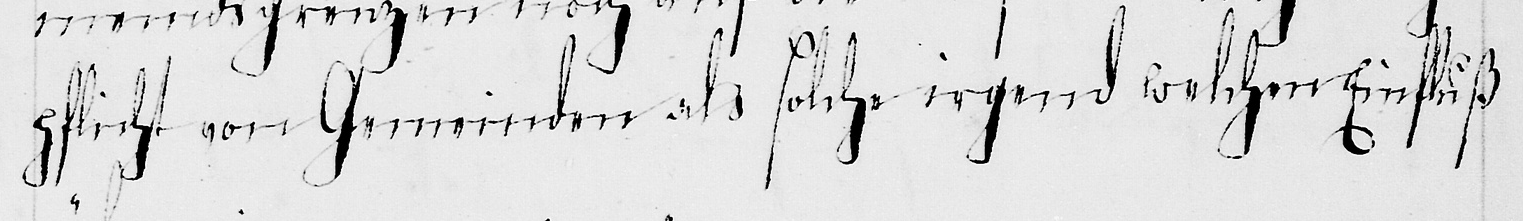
pflicht von Gemeinden als solche irgend welchen Einfluß
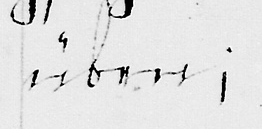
üben;
